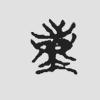填
